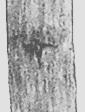十
